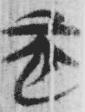而
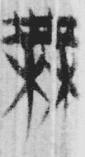無
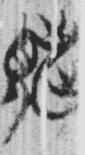○（盜）
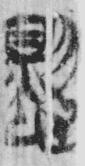惻（賊）
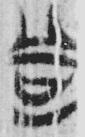甚
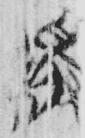緩
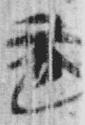而
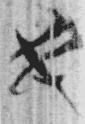民
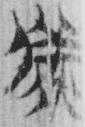備（服）
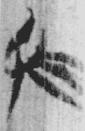於
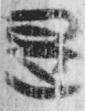是
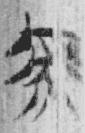{虍介}（乎）
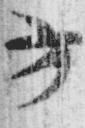方
